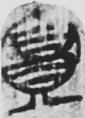實
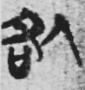咎
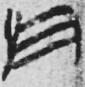於
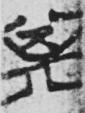其
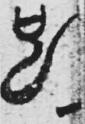也
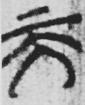天
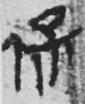保
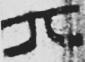亓（其）
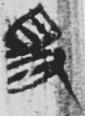○（得）
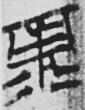彔（祿）
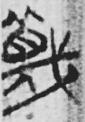蔑
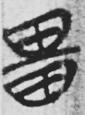畺（疆）
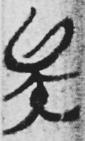矣
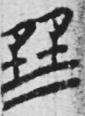巽
